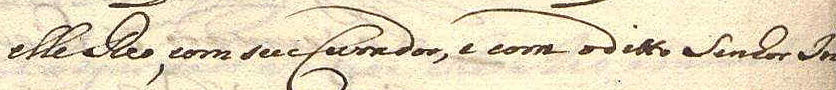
elle Reo, com seu Curador, e com o ditto Senhor In
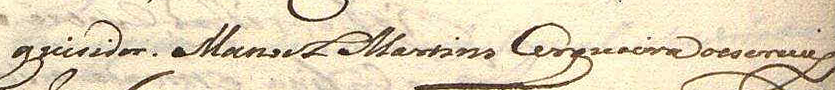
quisidor. Manoel Martins Cerqueira o escreuj
